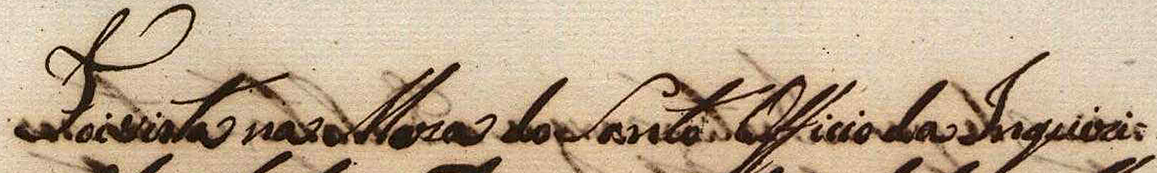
Foi vista na Meza do Santo Officio da Inquizi
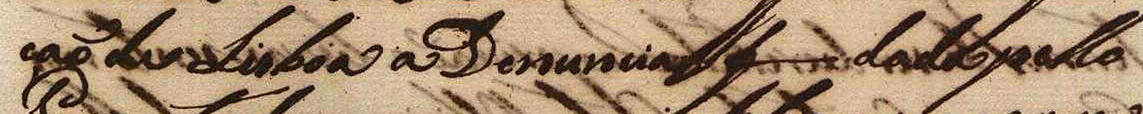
çaõ de Lisboa a Denuncia f dado pello
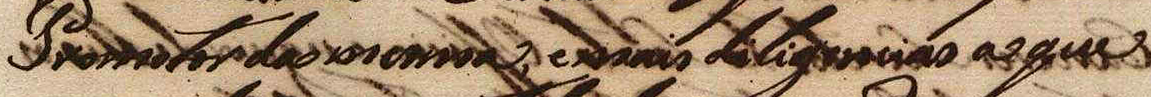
Promotor da mesma, e mais diligencias a que
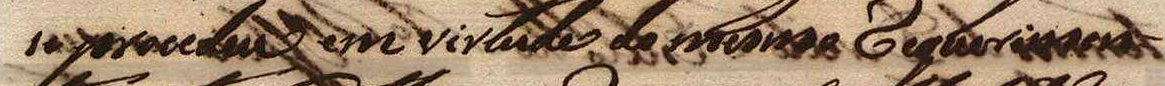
se procedeu em virtude do mesmo Requerimen
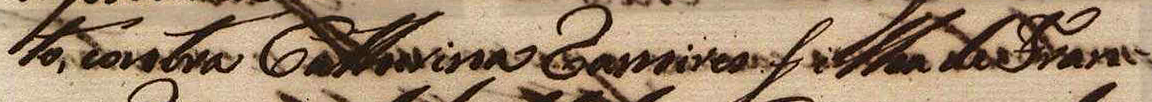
to, contra Catherina Ramires filha de Fran
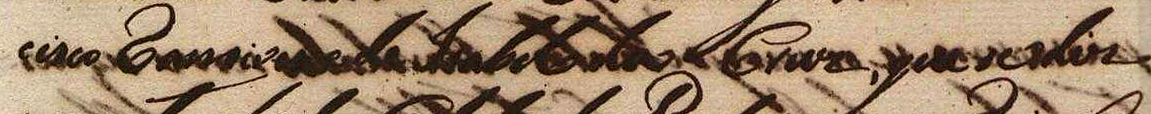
cisco Ramires e de Izabel da Cruz, que se diz
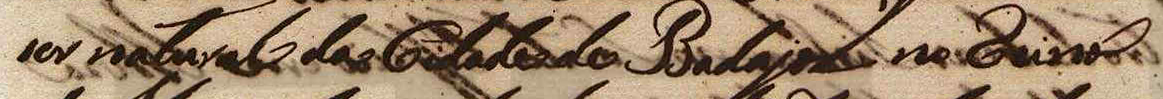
ser natural da Cidade de Badajoz no Reino
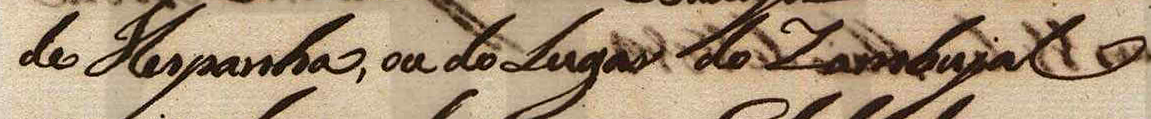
de Hespanha, ou do Lugar do Zambujal
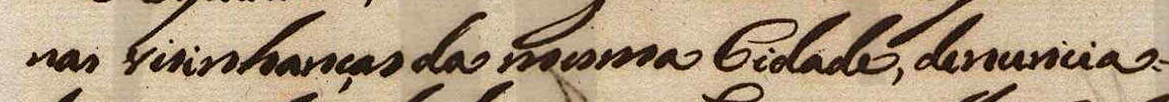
nas visinhanças da mesma Cidade, denuncia
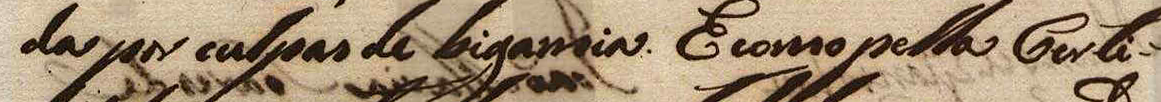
da por culpas de bigamia. E como pella Certi
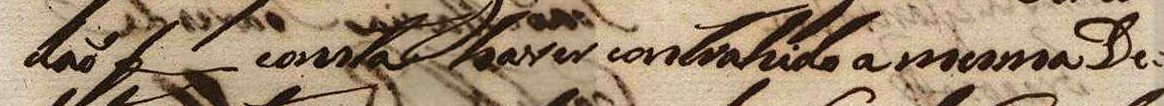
daõ f consta haver contrahido a mesma De
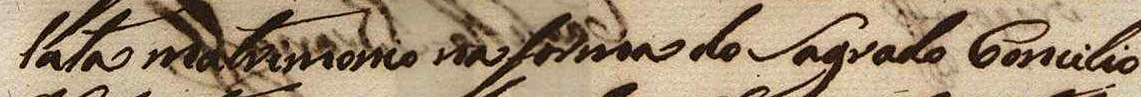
lata matrimonio na forma do Sagrado Concilio
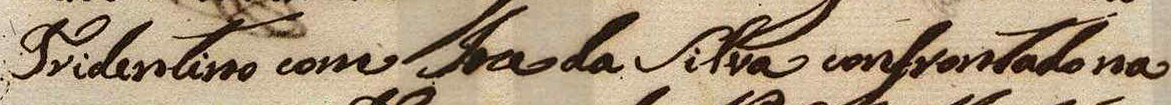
Tridentino com Ioze da Silva confrontado na
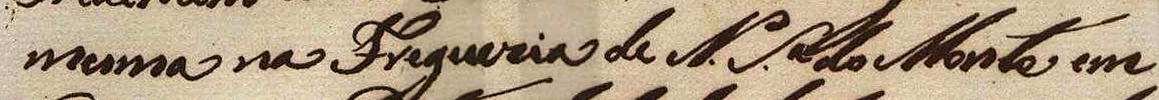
mesma na Freguezia de N. S.a do Monte em
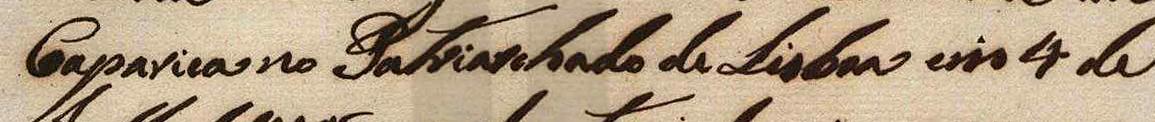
Caparica no Patriarchado de Lisboa em 4 de
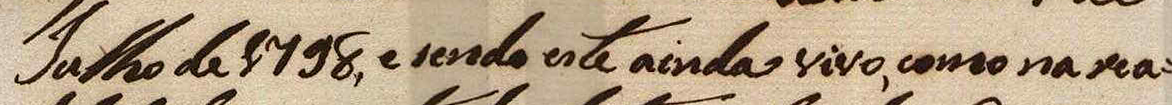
Iulho de 1798, e sendo este ainda vivo, como na rea
